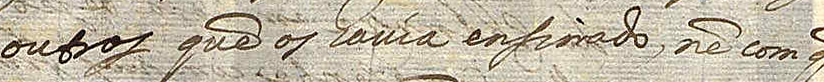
outros quē os hauia ensinado, nē com q̄
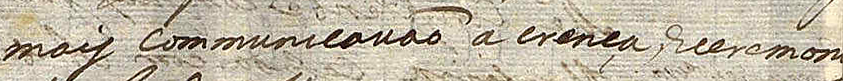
mais communicauão a crença, E ceremon_
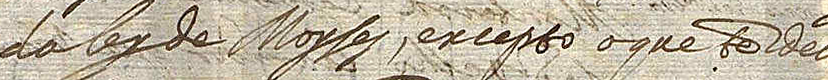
da ley de Moyses, excepto o que tē dec_
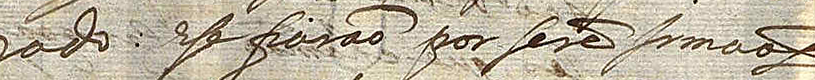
rado: E se fiarão por serē jrmaõs
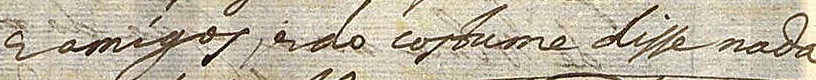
E amigos, E do costume disse nada
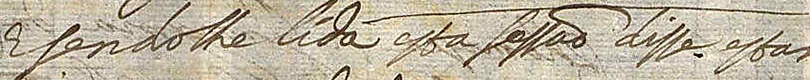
E sendolhe lida esta sessaõ disse estar
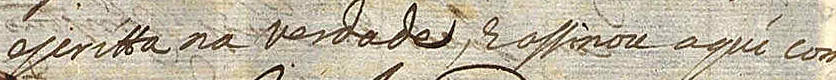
escritta na verdade, E assinou aqui com
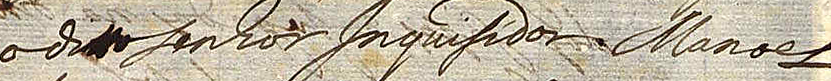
o ditto senhor Jnquisidor Manoel
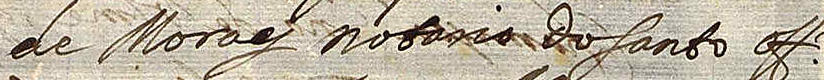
de Moraes notario do santo off.o
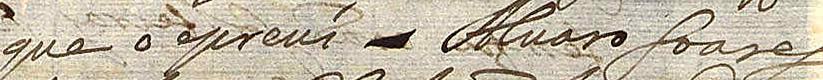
que o escreui - Aluaro soares
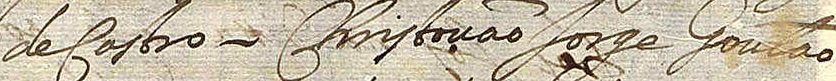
de Castro - Christouão Jorge Goulão
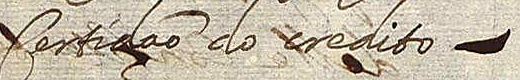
Certidaõ do credito -
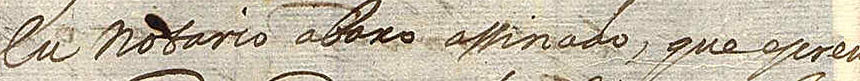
Eu notario abaxo assinado, que escreu_
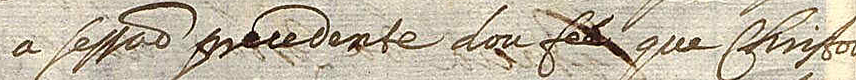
a sessão precedente dou feé que Christo_
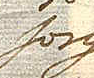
Jorg_
